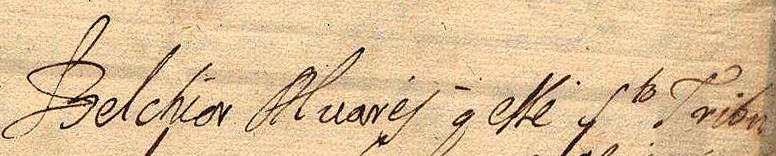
Belchior Aluares q̄ elle S.to Tribu
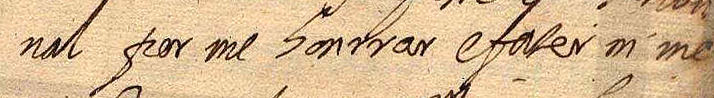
nal por me honrrar e fazer m me
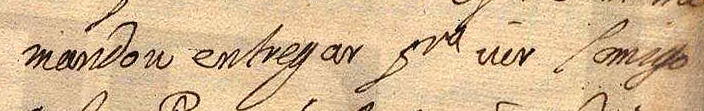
mandou entregar pra uir Comigo
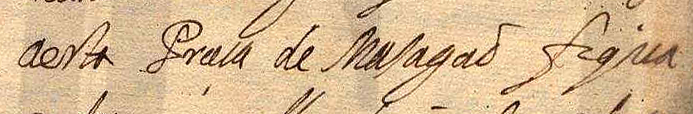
a esta Praça de Mazagaõ fiqua
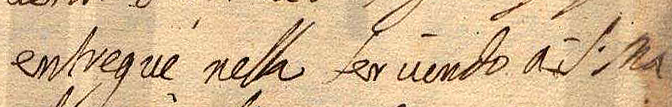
entregue nella seruindo a S. Ma
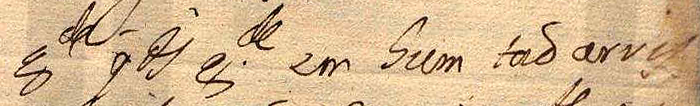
gde q̄ ds̄ g.de em hum taõ arris
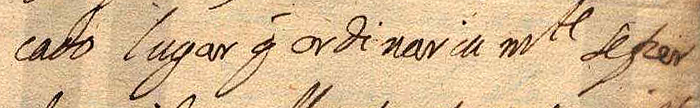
cado lugar q̄ ordinariamte se per
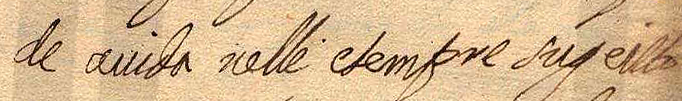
de a uida nelle e sempre sugeitto
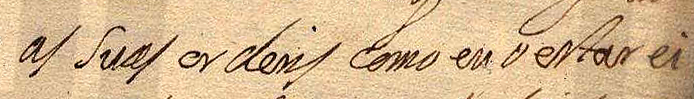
as suas ordens como eu o estar ei
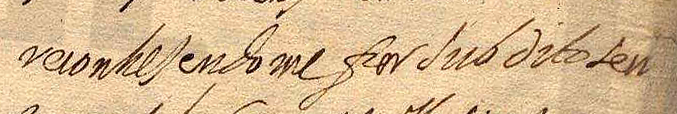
reconhesendome por subdito seu
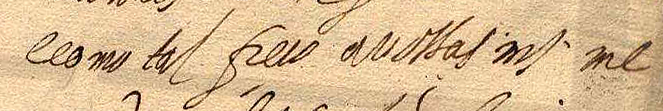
e como tal peço a vossas ms. me
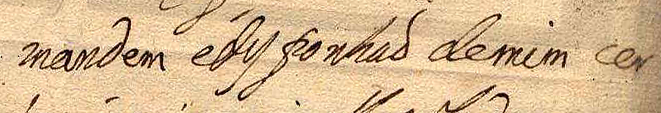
mandem e disponhaõ de mim cer
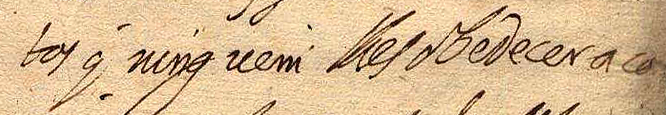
tos q̄ ninguem lhes obedecera co
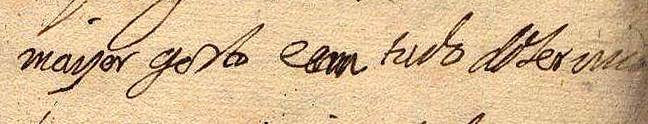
mayor gosto e em tudo do seruiço
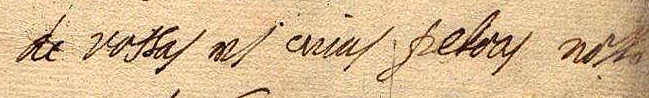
de vossas ms cuias pesoas nosso
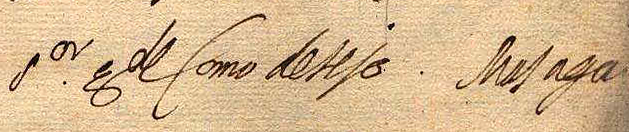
sor. gde Como desejo. Masagaõ
